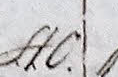40.
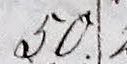50.
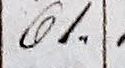61.
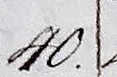40.
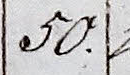50.
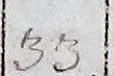33
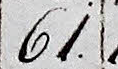61.
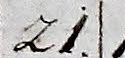21.
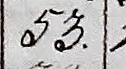53.
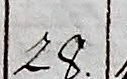28.
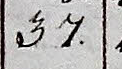37.
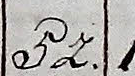52.
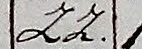22.
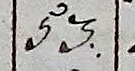53.
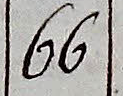66
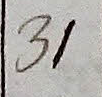31
